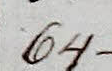64
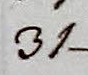31
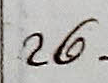26
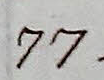77
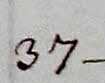37
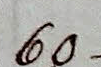60
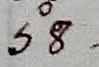58
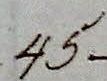45
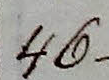46
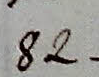82
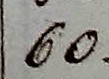60
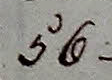56
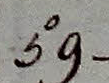59
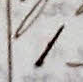1
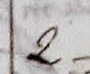2
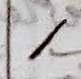1
